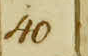40
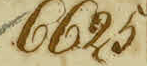6625
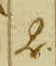2.
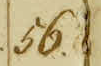56.
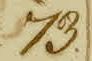73.
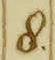8.
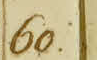60.
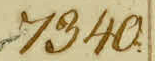7340.
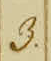3.
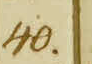40.
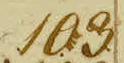103.
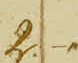2.
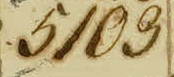5103
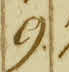9.
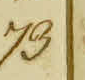73
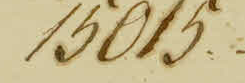15015.
